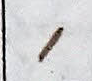1
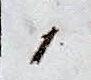1
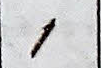1
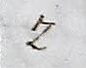2
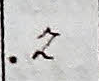2
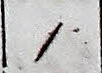1
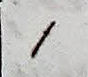1
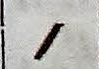1
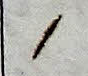1
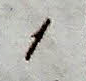1
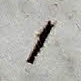1
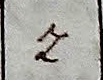2
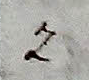2
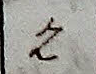2
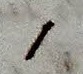1
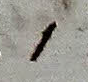1
